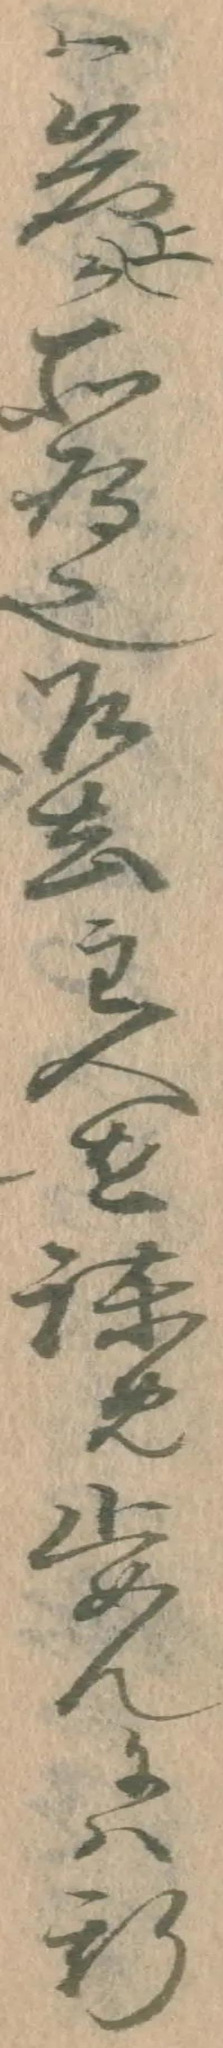は差上け所為也乍去主人を諌免止めん尓は斯
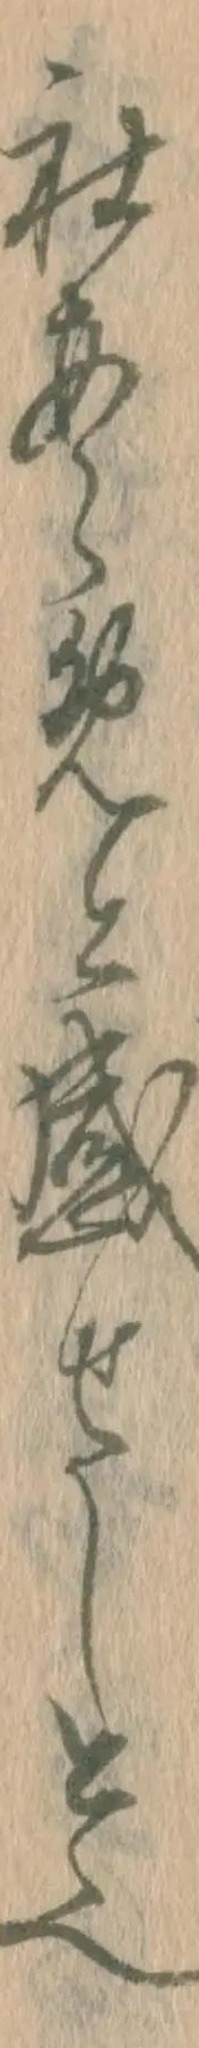被あら免と感せしと也
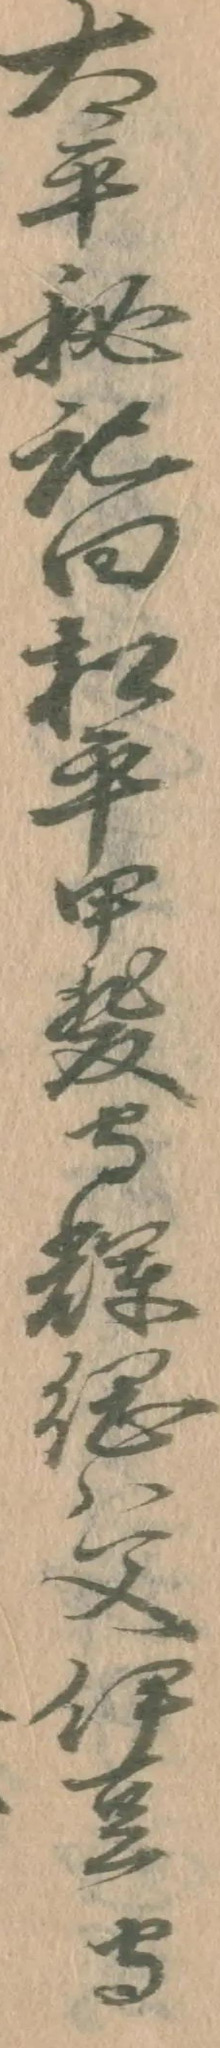太平秘記曰松平甲斐守輝綱は父伊豆守
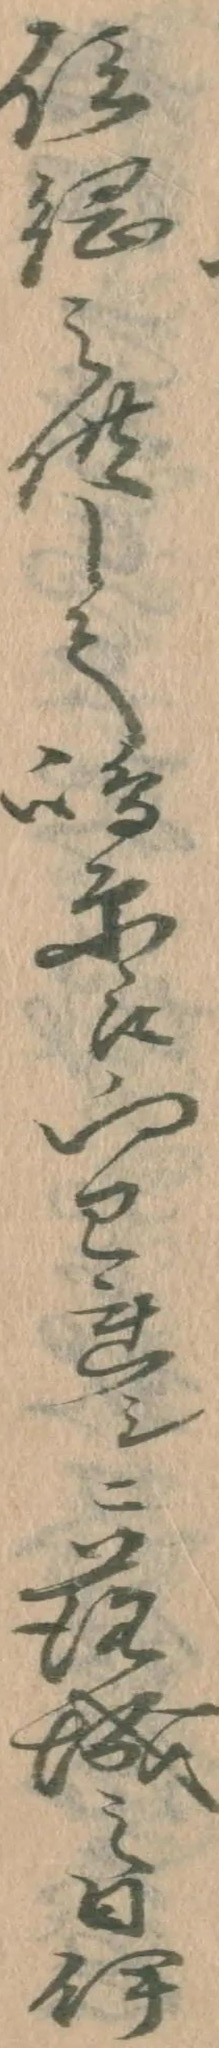信綱之供して島原江向己連しに落城之日伊
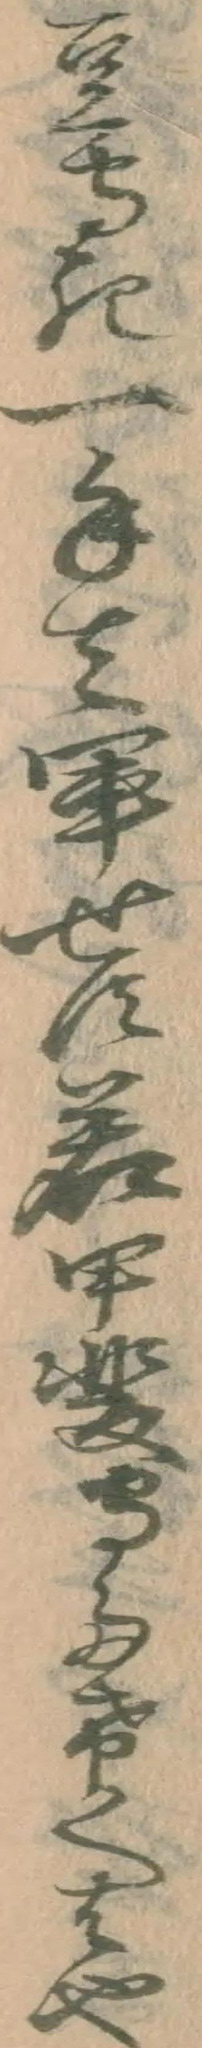豆守歟一手者軍せ須若甲斐守多希く者や
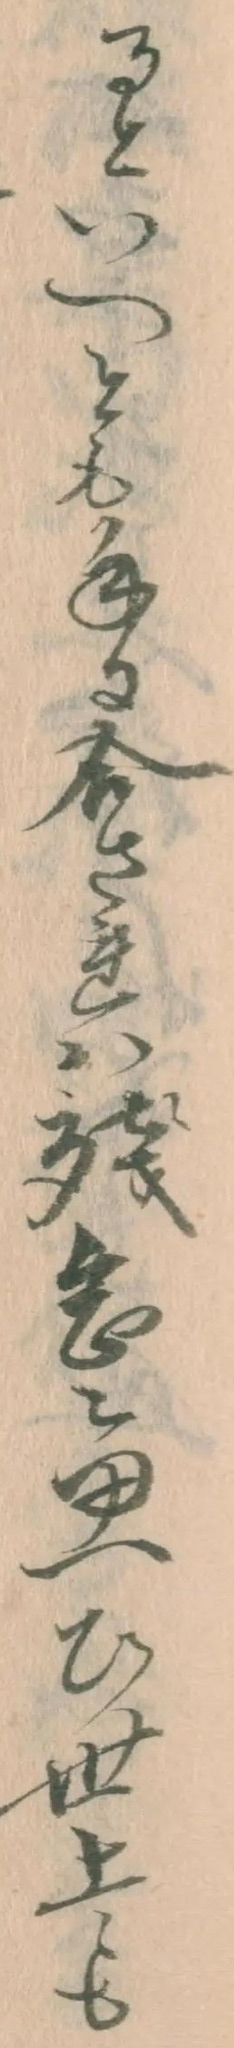るといへとも手尓合さ連は残念に思ひ世上にも
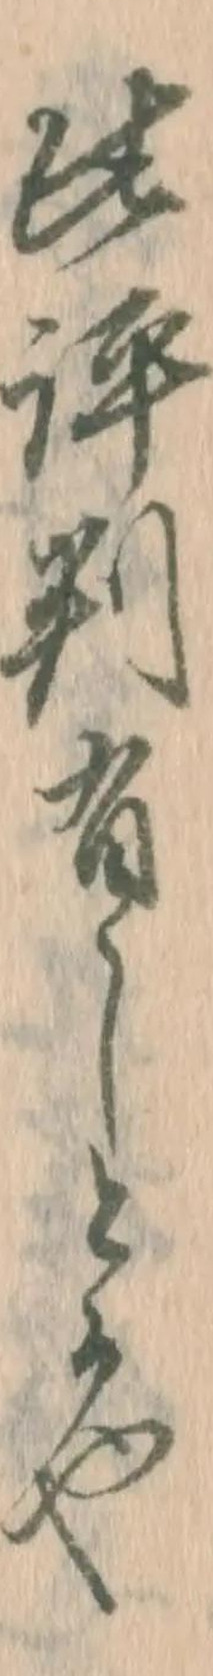此評判有しとか也
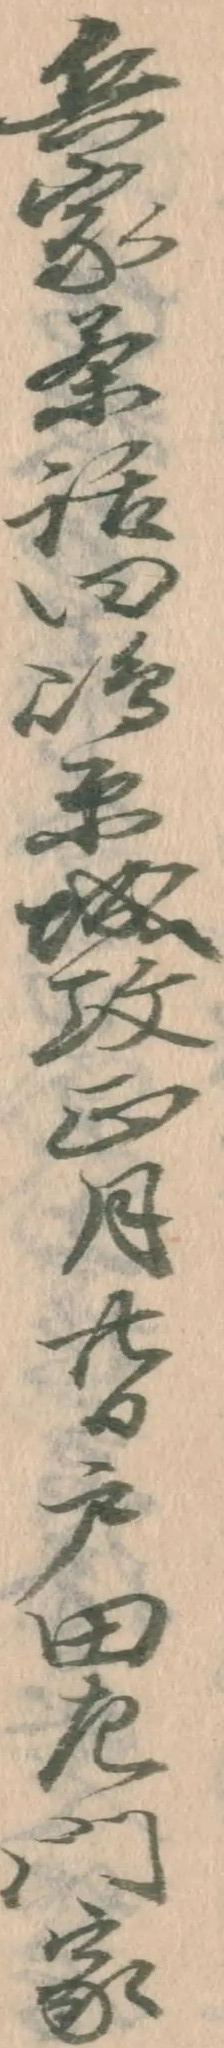兵家茶話曰島原城攻正月廿日戸田左門家
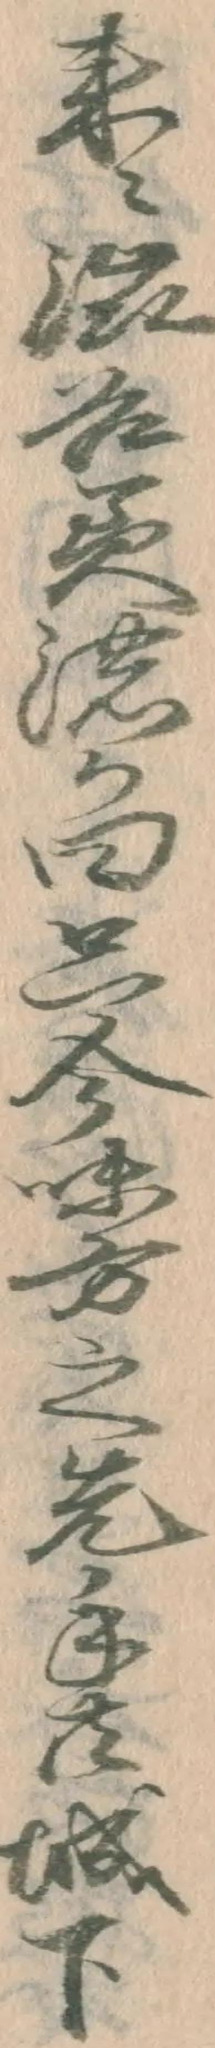来に渋谷美濃か曰只今味方之先手共城下
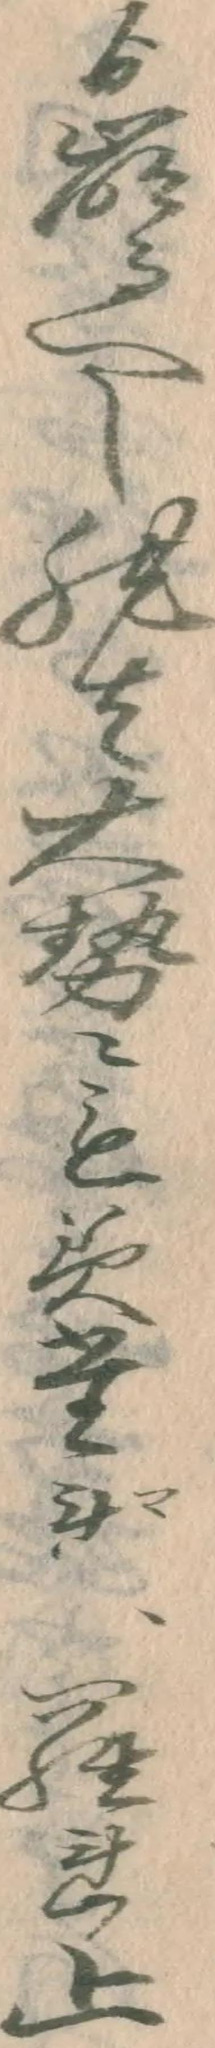ゟ崩るへし然者大勢にも美堂連羅連止
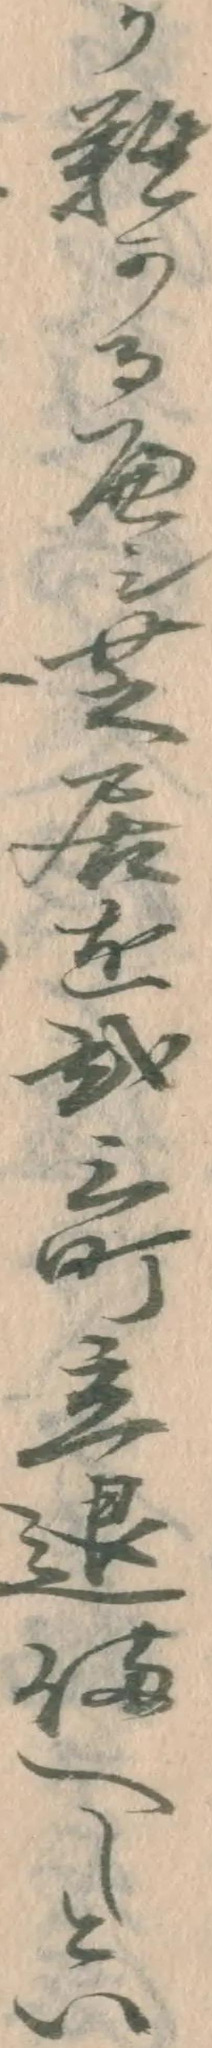り難可る扁し芝居を弐三町立退備へしとい
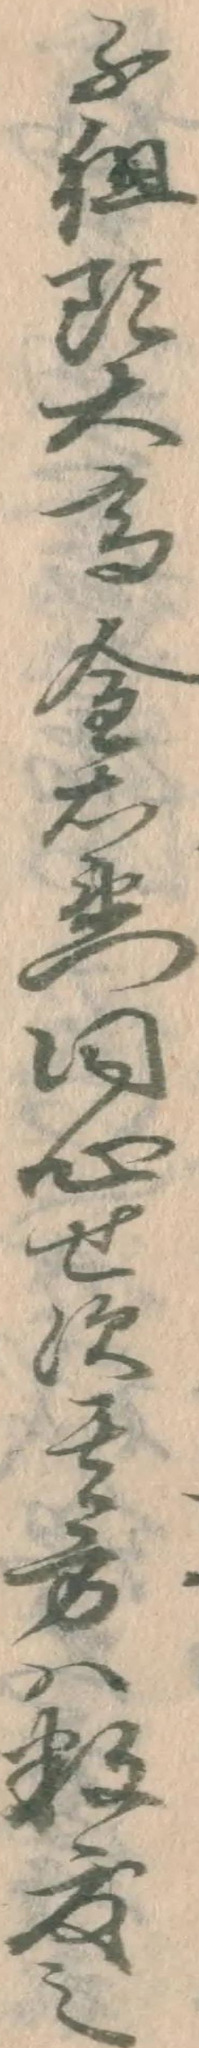ふ組頭大高金右衛門同心せ須其方は数度之
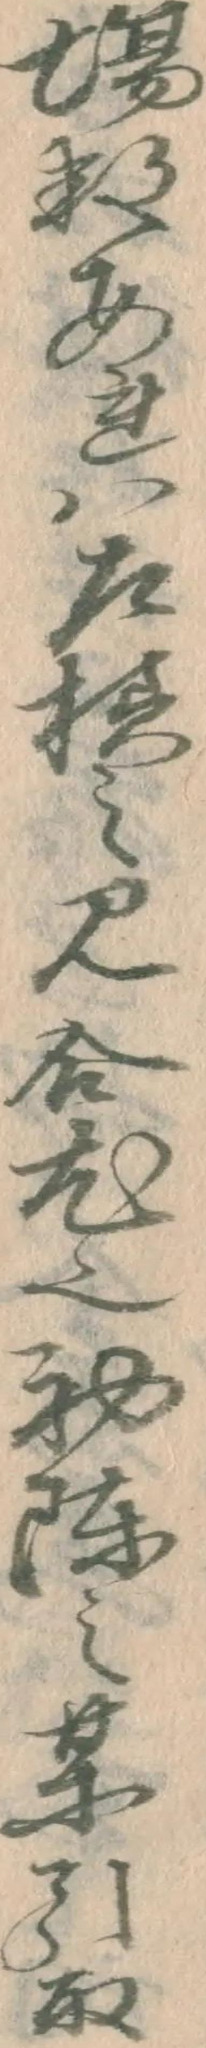場数あ連は左様之見合尤也初陣之某引取
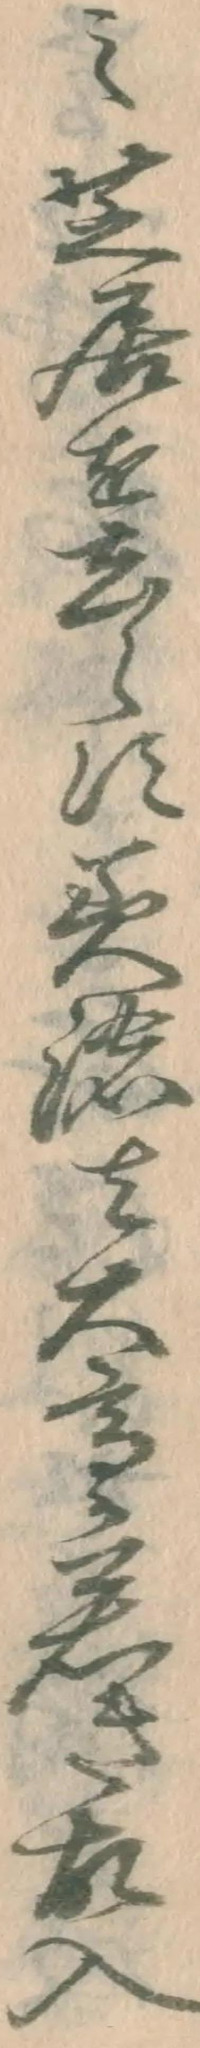之芝居を志ら須美濃者大高か若き故入

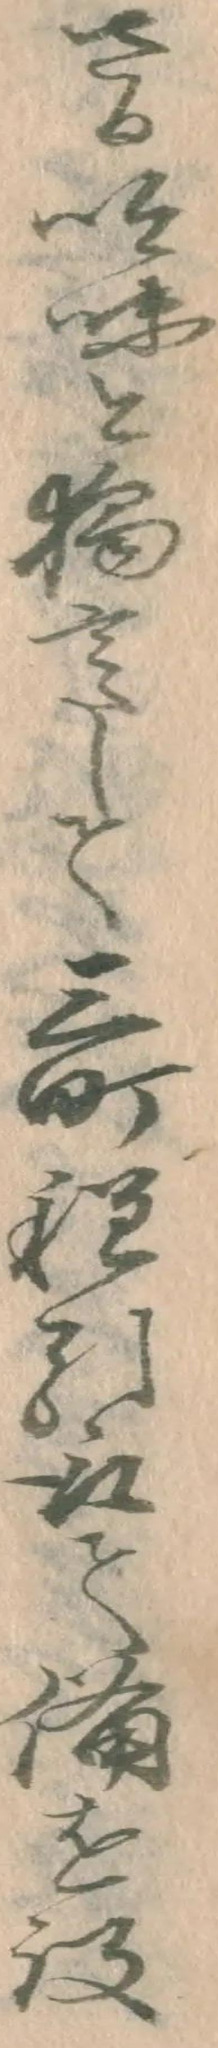さる吟味と独言して三町程引取て備を設
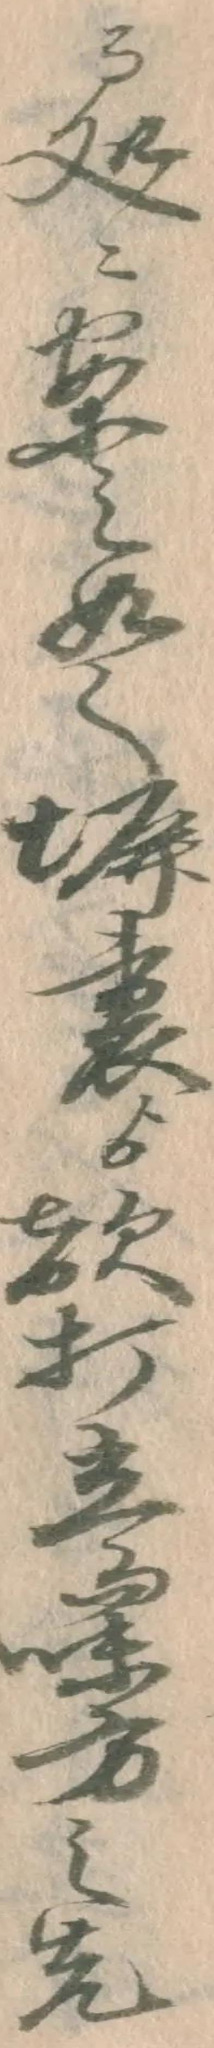る処に案之如く塀裏ゟ敵打立而味方之先
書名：切支丹御退治記 49巻. [8]
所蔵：国立国会図書館 National Diet Library, JAPAN
